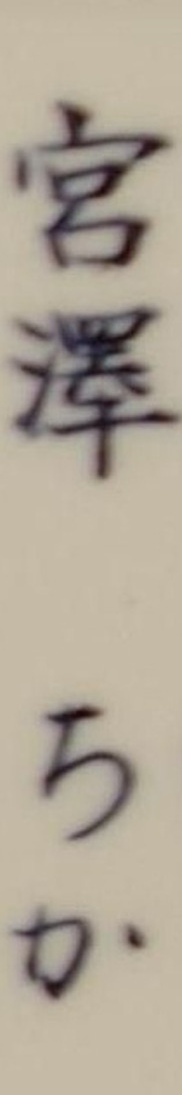宮澤ちか
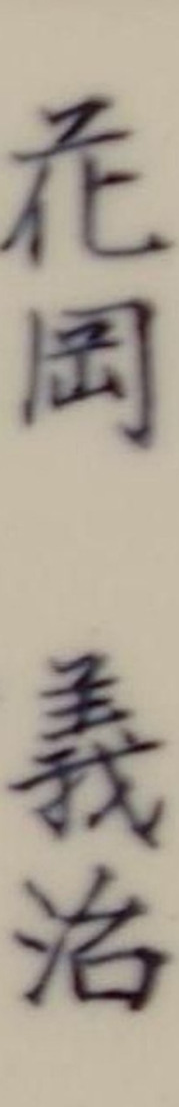花岡義治
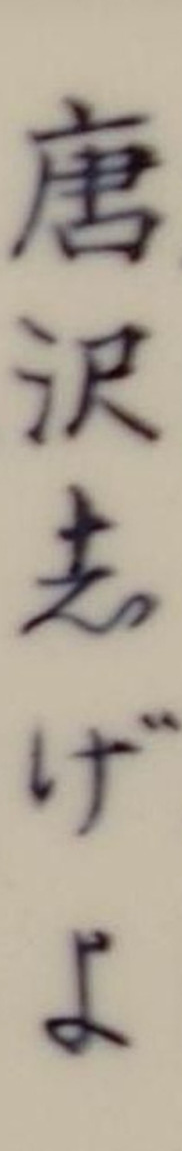唐沢しげよ
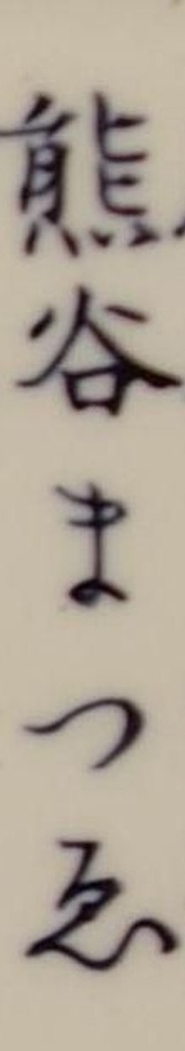熊谷まつゑ
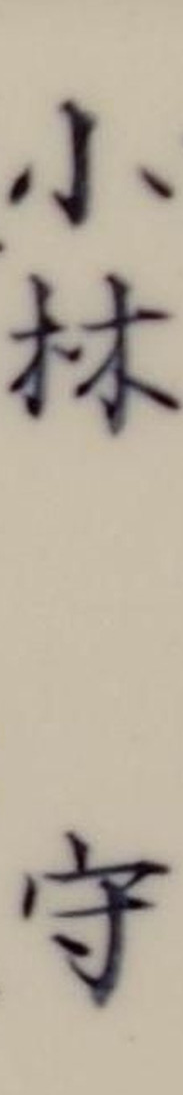小林守
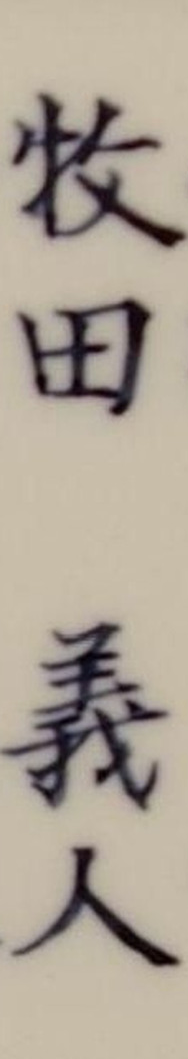牧田義人
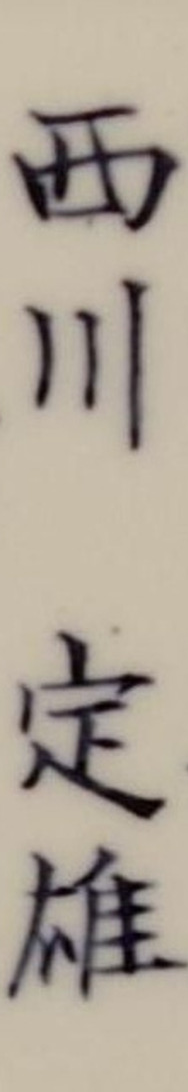西川定雄
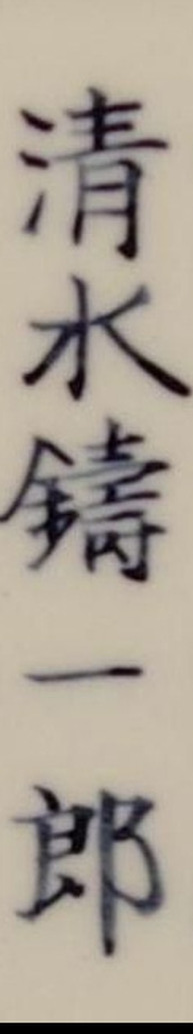清水鋳一郎
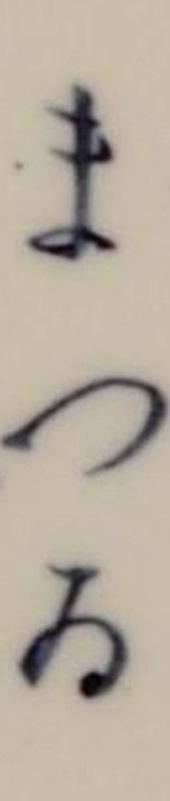まつる
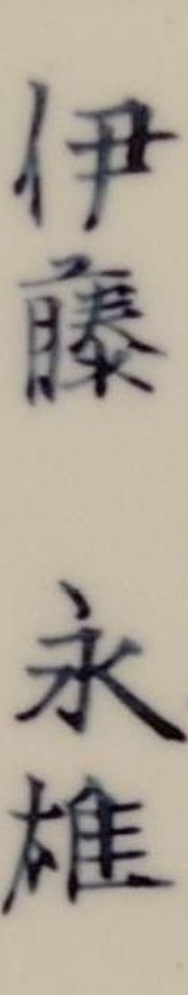伊藤永雄
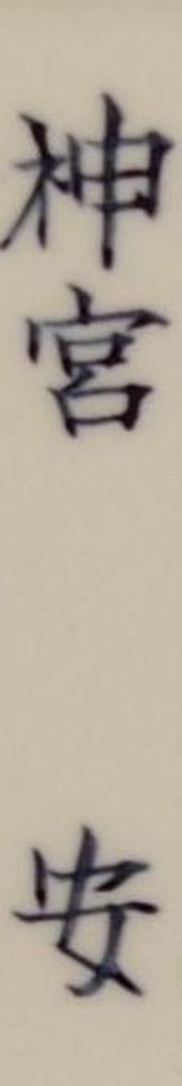神宮安
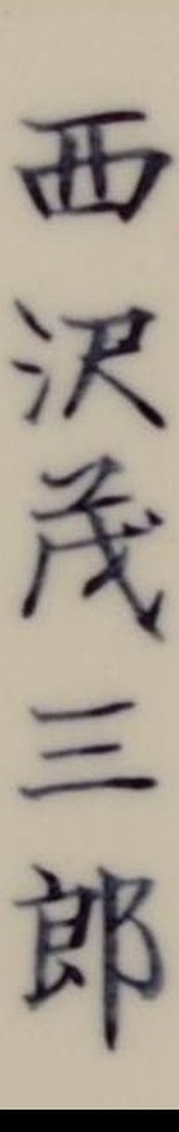西沢茂三郎
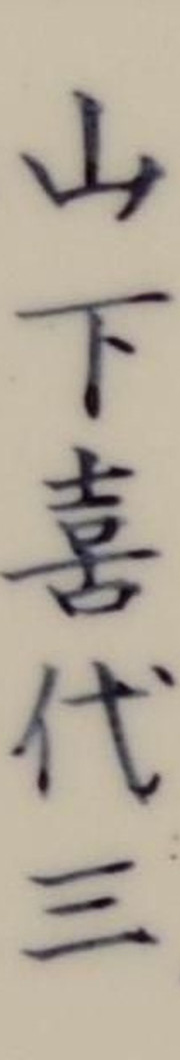山下喜代三
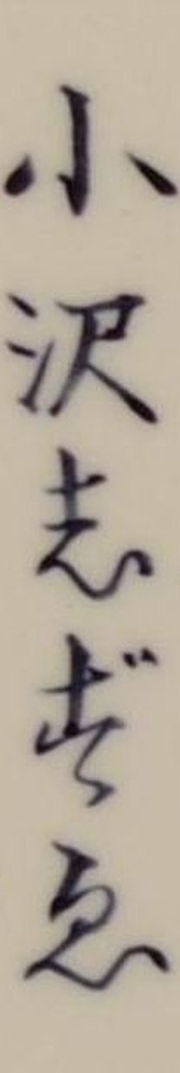小沢しずゑ
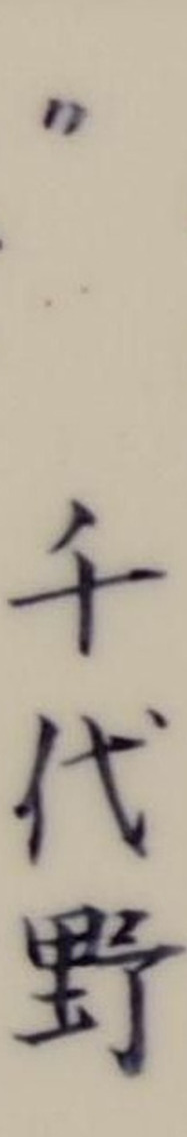千代野
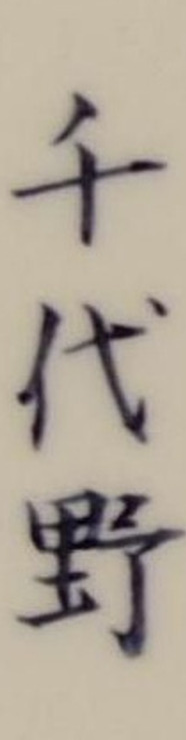千代野
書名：M~S
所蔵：高野山金剛峯寺
